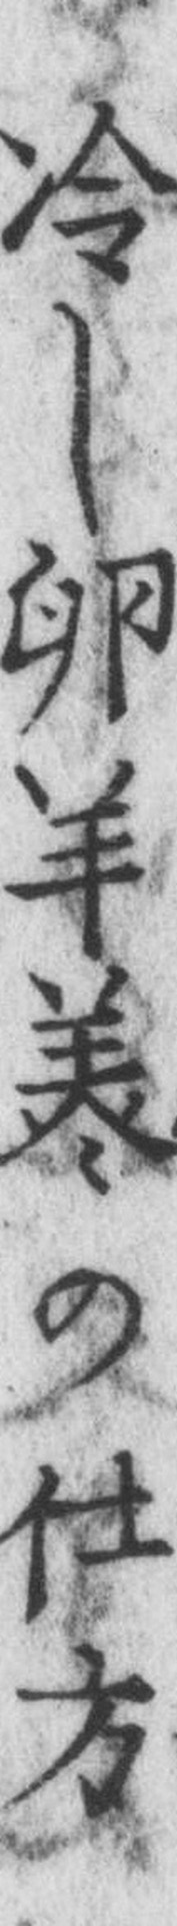冷し卵羊羹の仕方
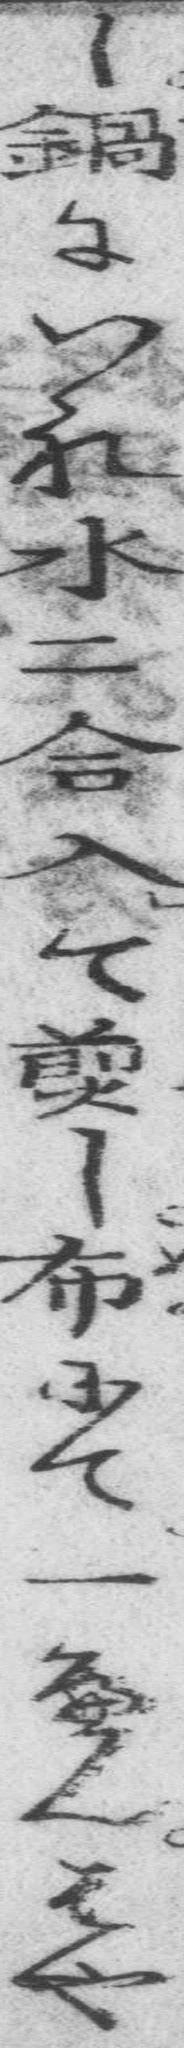し。鍋にいれ。水二合入れて。煎し。布にて。一へん。はや
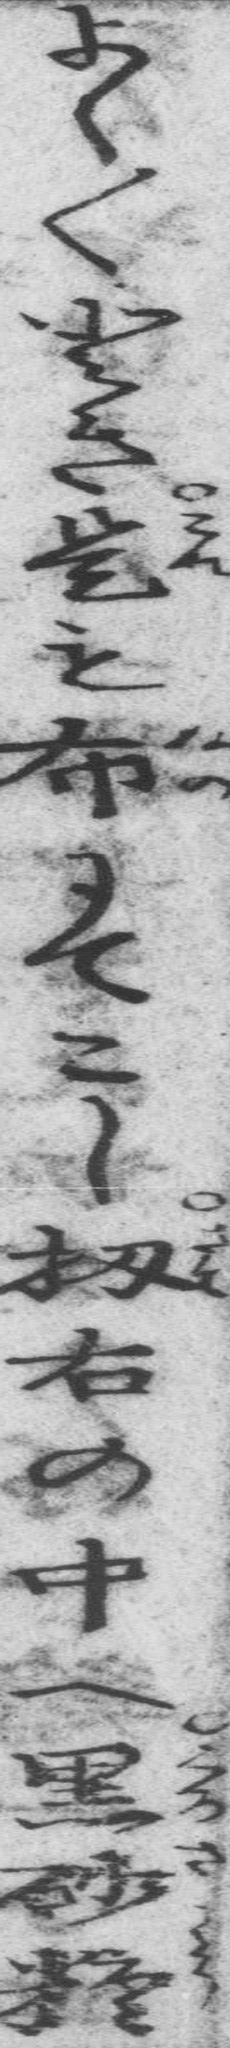よく〳〵とき。是も布にてこし。扨右の中へ。黒砂糖
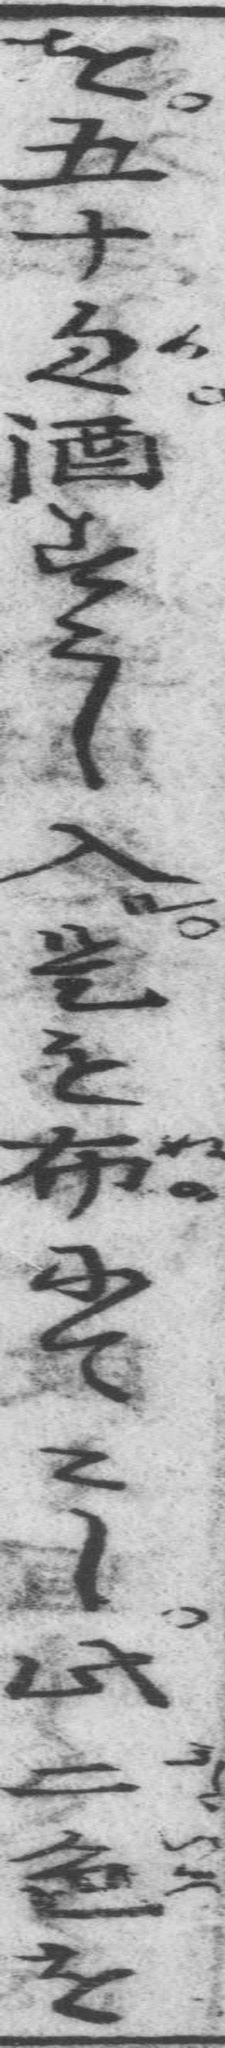を。五十匁。酒すこし入る。是も布にてこし。此二色を
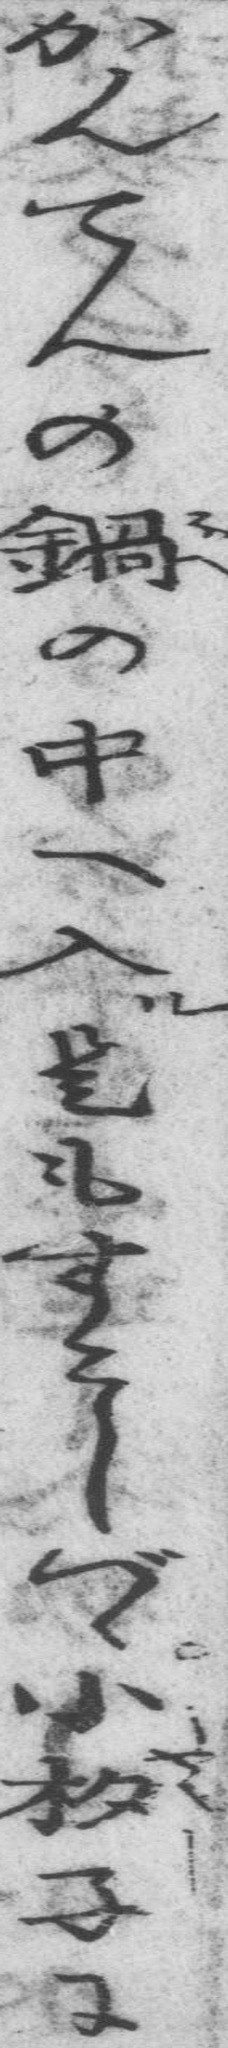かんてんの鍋の中へ入る是もすこしづゝ。小杓子に
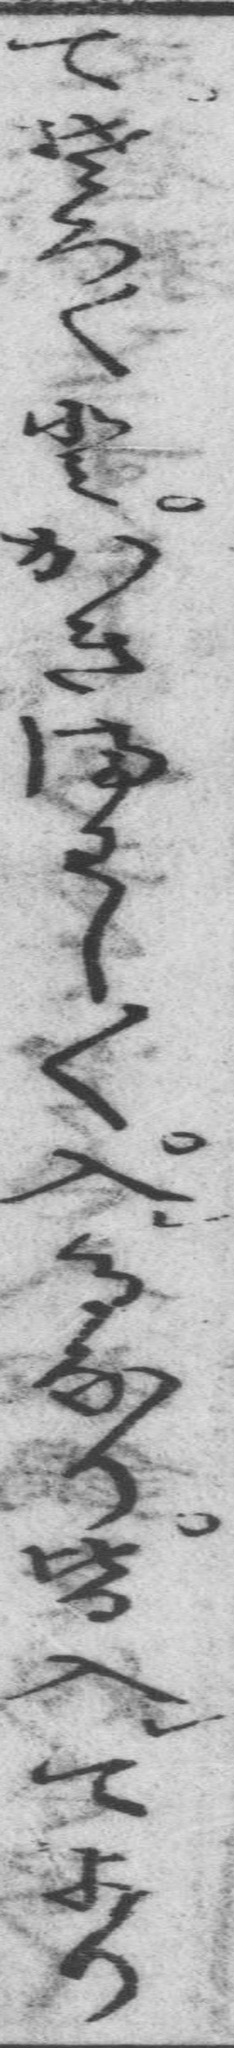て。そろ〳〵と。かきまわし〳〵。入れるなり。皆入れてより

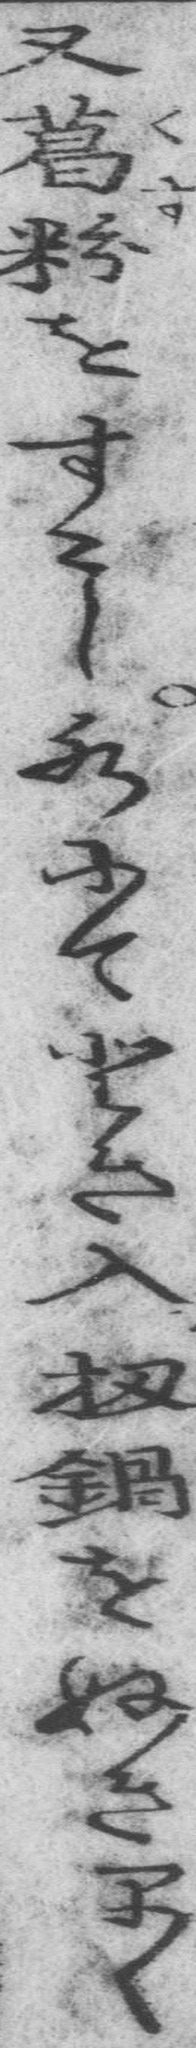又葛粉をすこし。水にてとき入れ。扨鍋をぬき早々
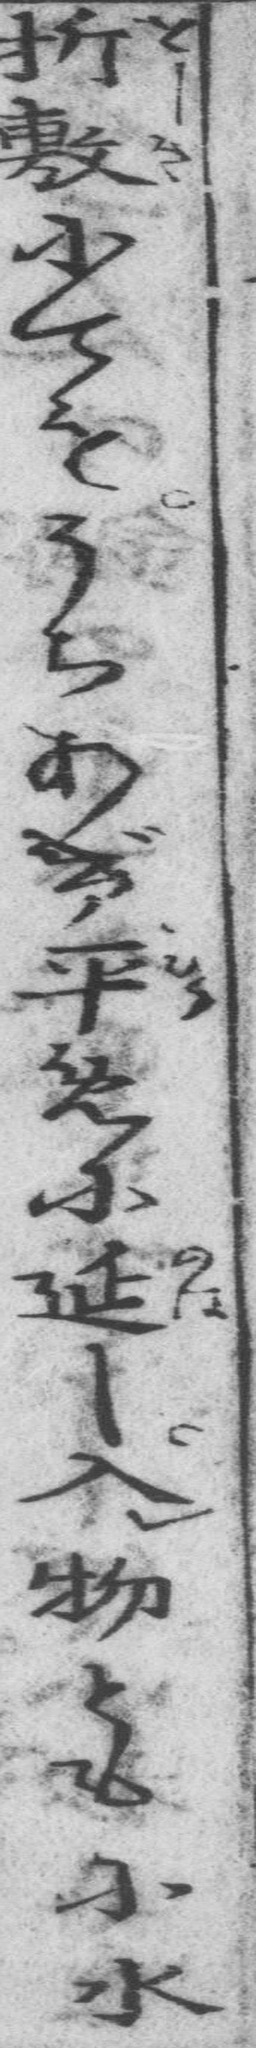折敷にても。うちあげ。平めに延し。入れ物ともに水
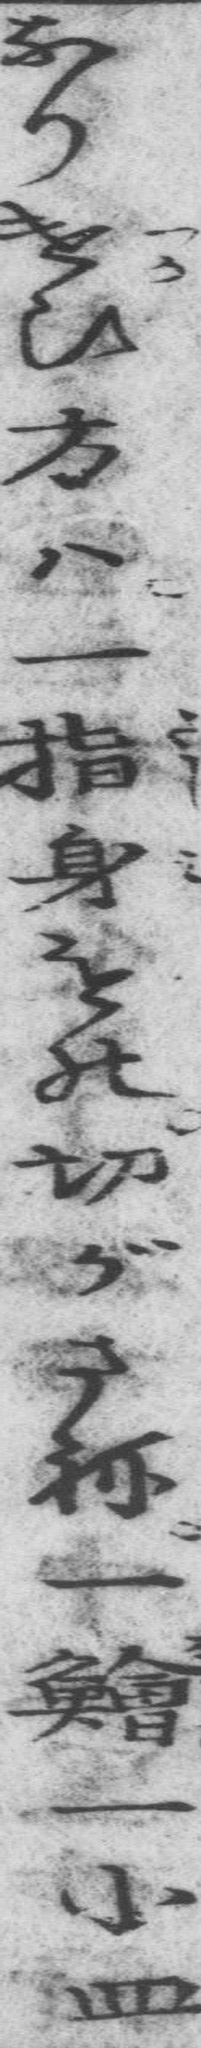なり遣ひ方は。一指身もの。切がさね。一鱠。一小皿
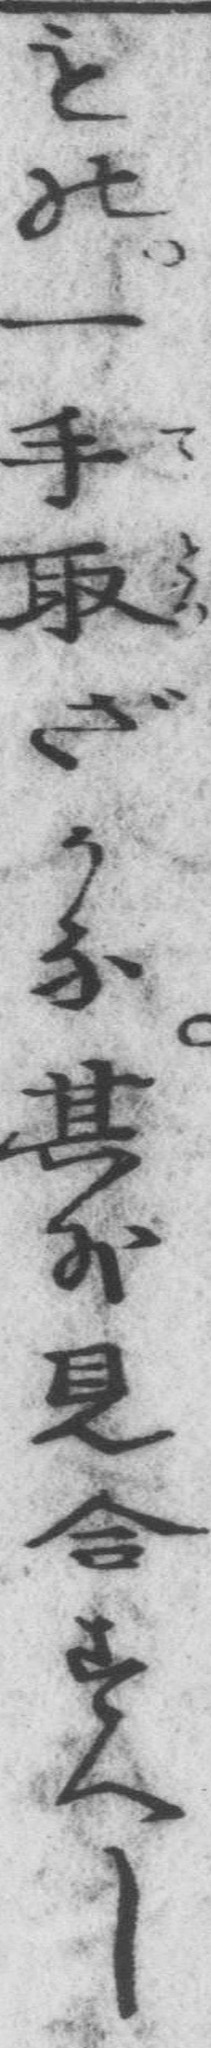もの。一手取ざかな。其外見合すへし
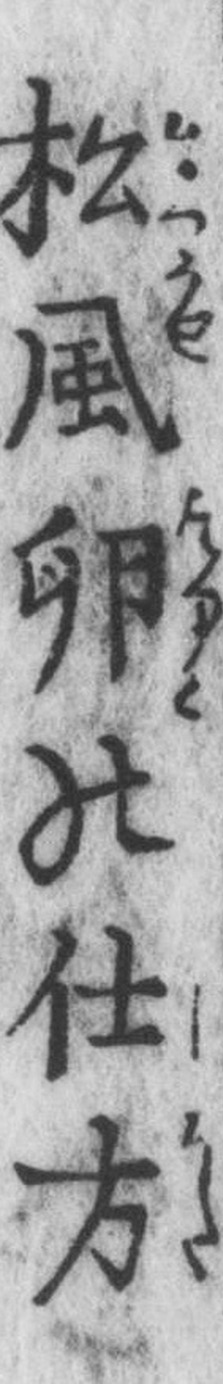松風卵の仕方
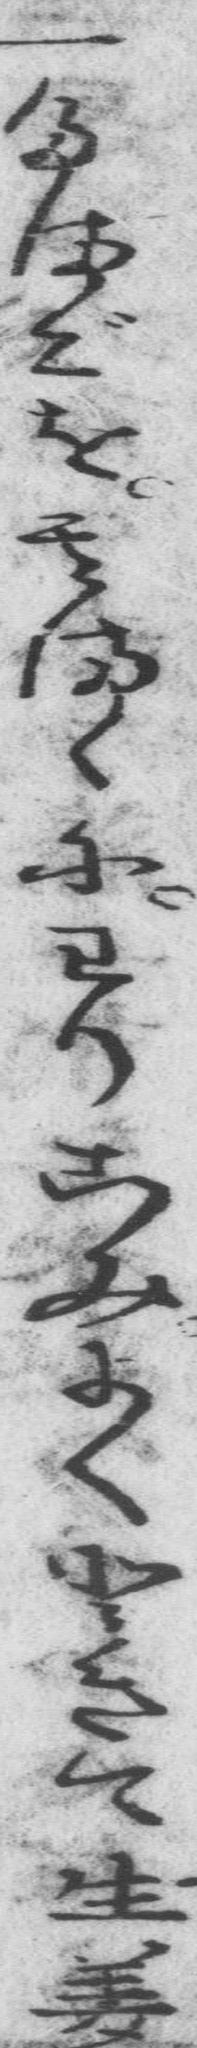一たまごを。其まゝに。わりこみ。よくときて。生姜
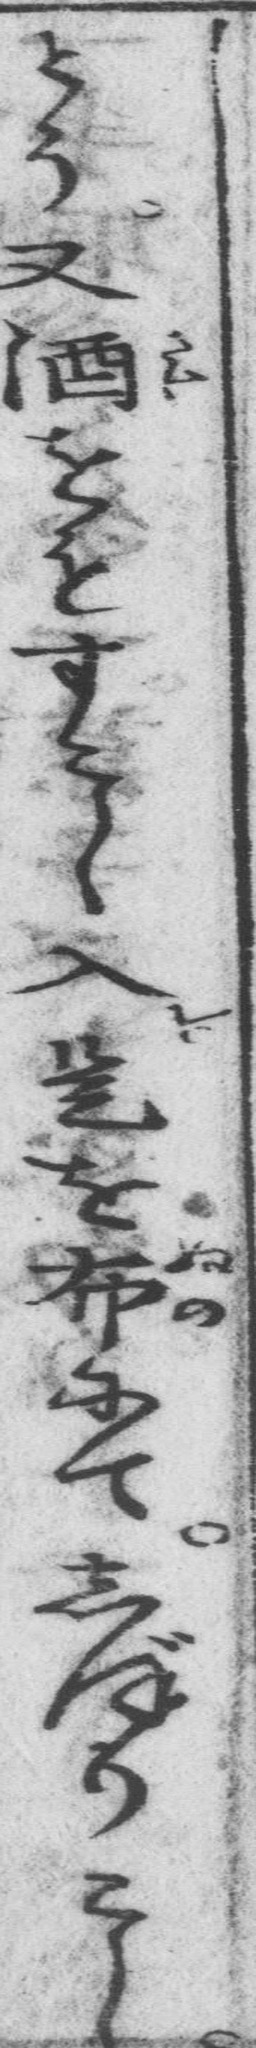とう。又酒をもすこし入れ。是を布にて。しぼりこし。
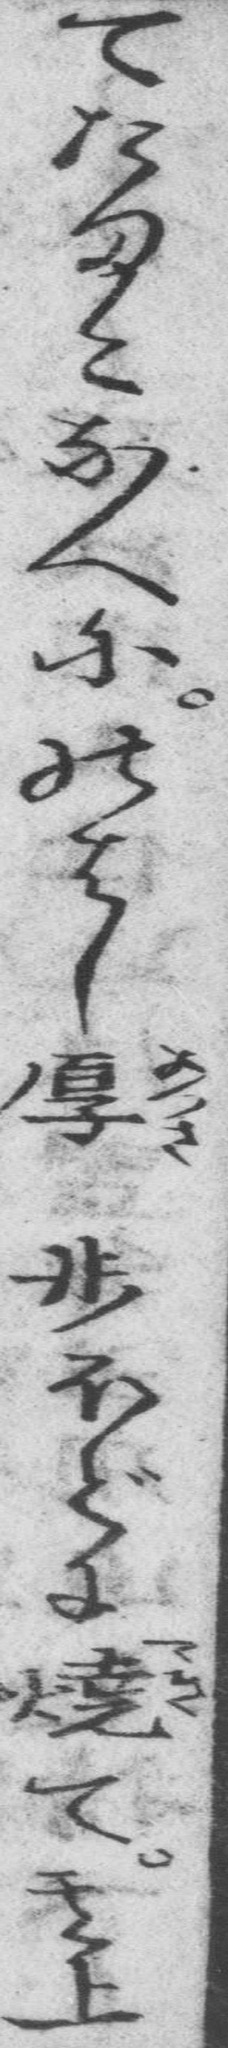てたまこなへに。のはし厚歩ほどに焼て。其上
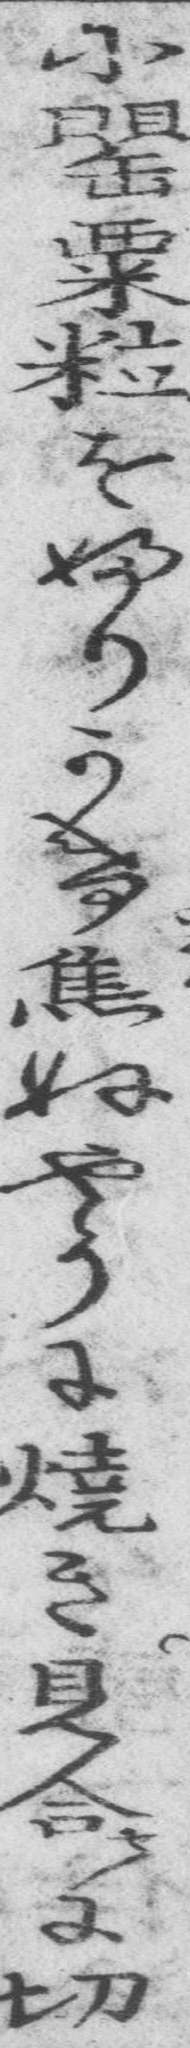に罌粟粒をふりかけ。焦ぬやうに焼き。見合せに切
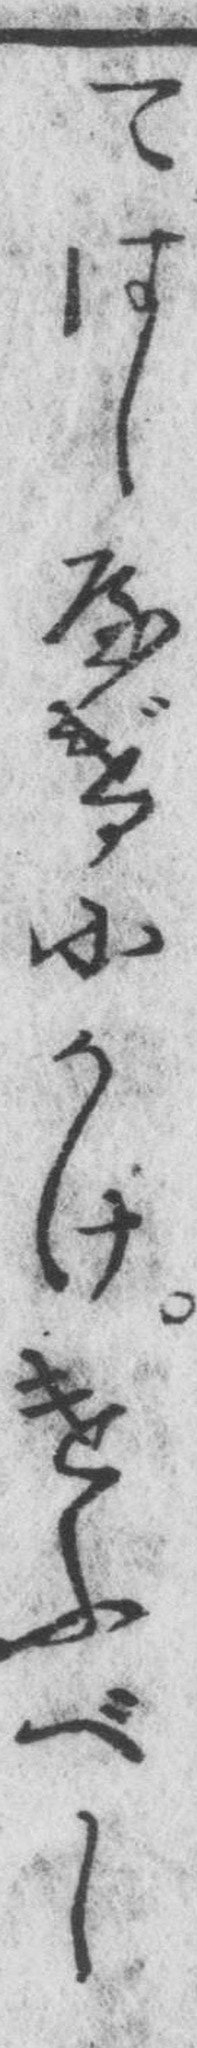て。はしやげにかけ。遣ふべし
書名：萬寳料理秘密箱
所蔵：大阪府立大学学術情報センター 国文学研究資料館
